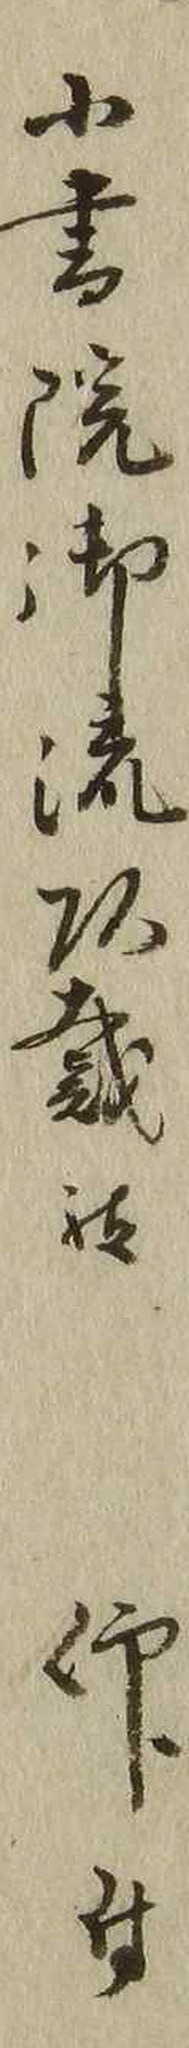小書院御流頂戴被仰付
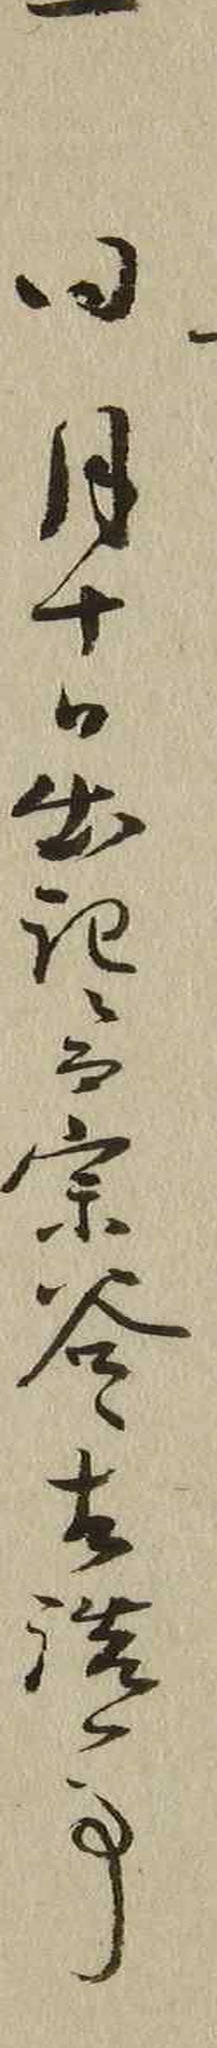一同月十日出記ニ而宗谷へ相詰候事
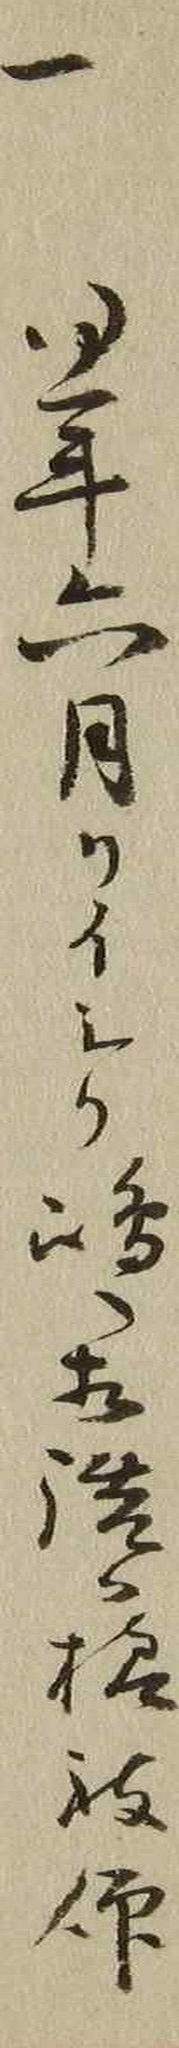一同年六月リイシリ嶋へ相詰候様被仰
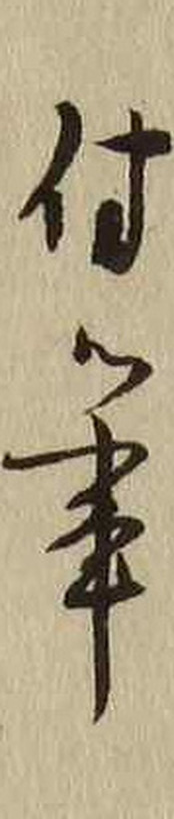付候事
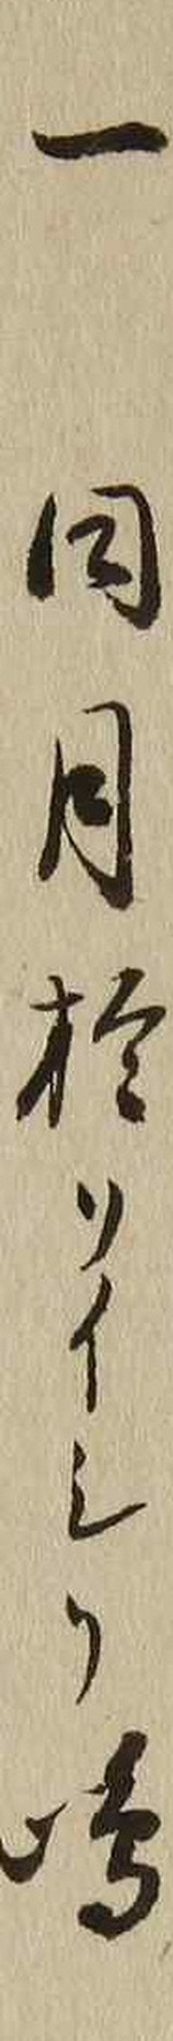一同月於リイシリ嶋
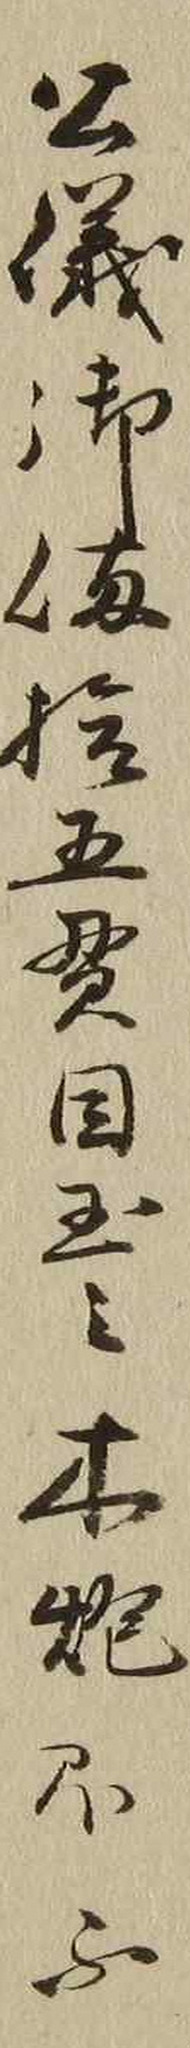公儀御備拾五貫目玉之木炮ほふ
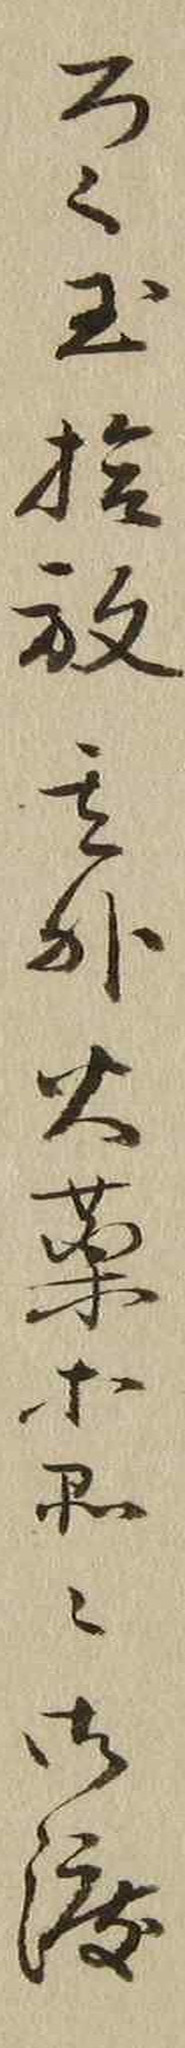ろく玉拾放其外火薬等品々御渡
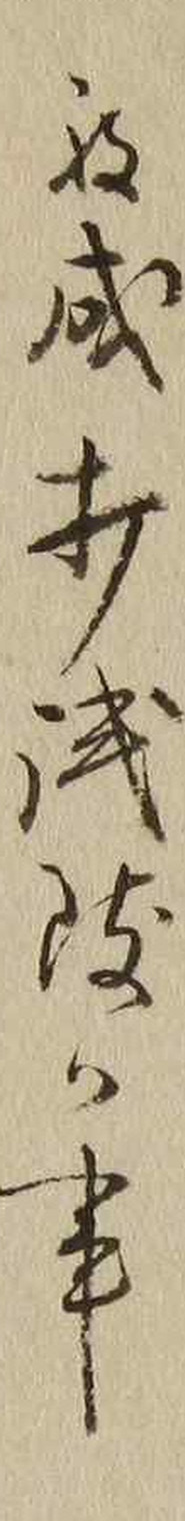被成打洩致候事
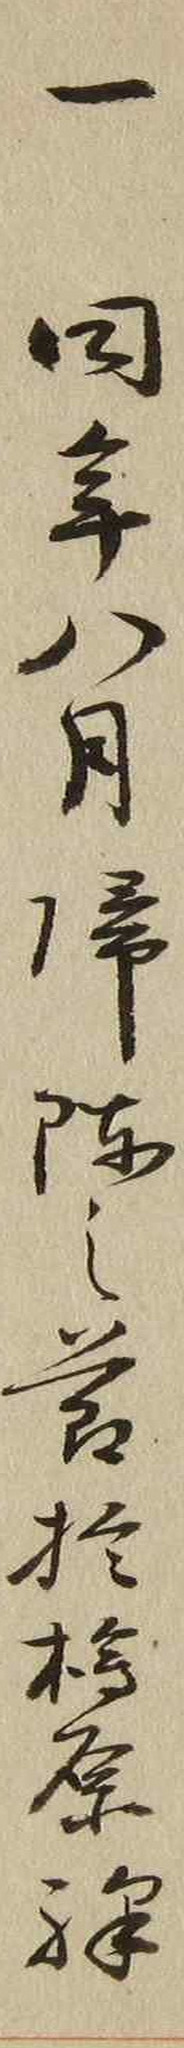一同年八月帰陣之節於檜原駅
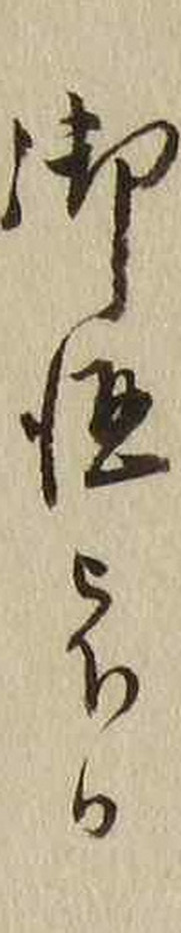御酒被下候
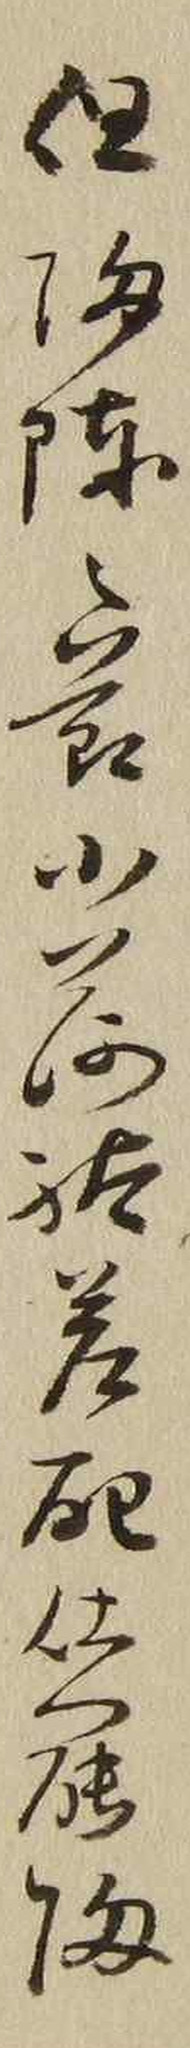但帰陣之節小荷駄差配仕罷帰
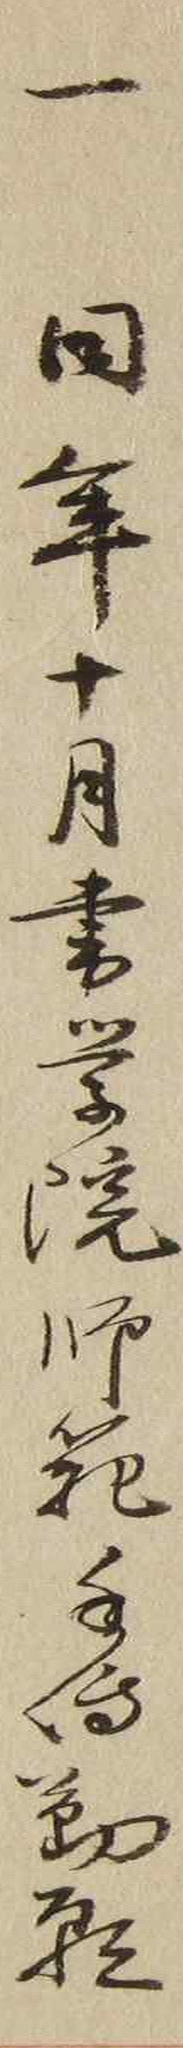一同年十月書学院師範手伝勤願

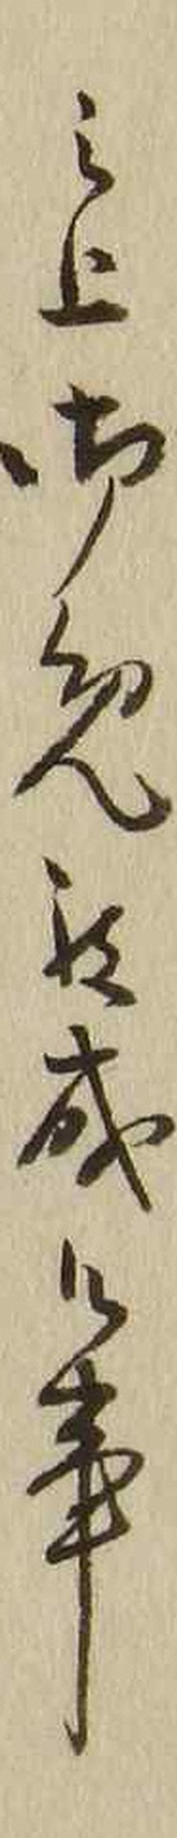之上御免被成候事
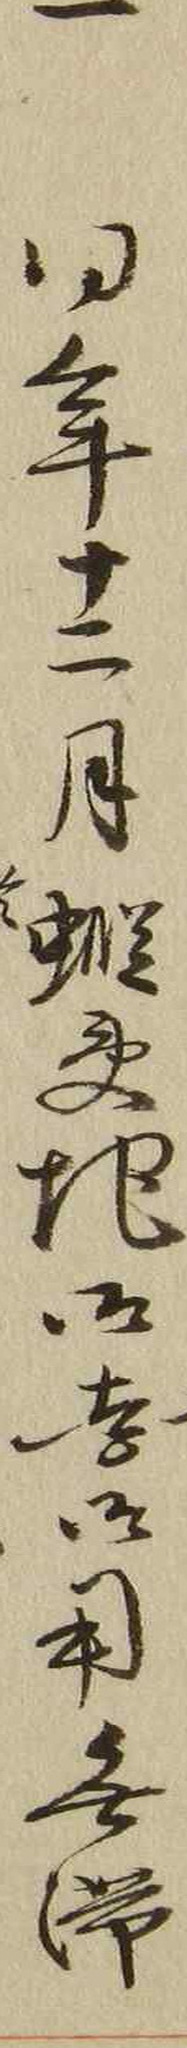一同年十二月蝦夷地御固御用無滞
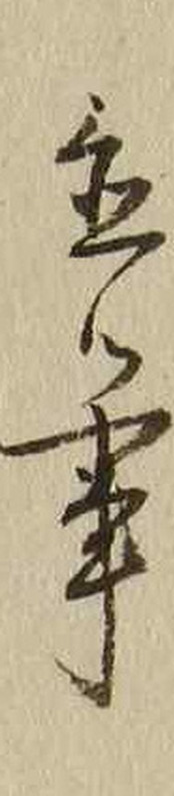置候事
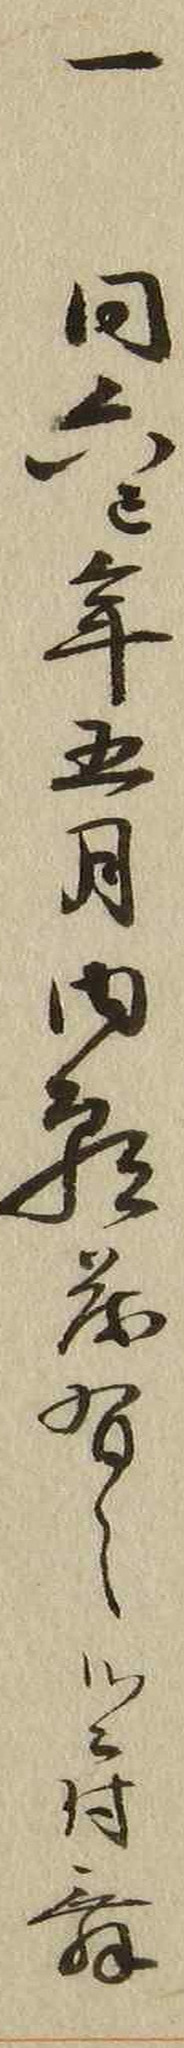一同六巳年五月内願茂有之候ニ付舞
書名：諸士系譜　巻之221　ま之部2
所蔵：会津若松市立会津図書館
